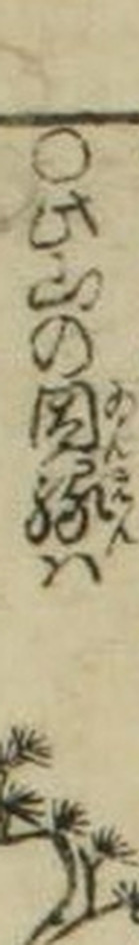○此山の因縁は
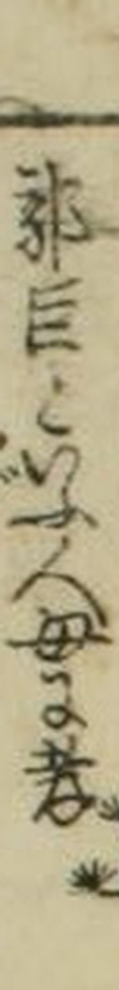郭巨といふ人母に孝
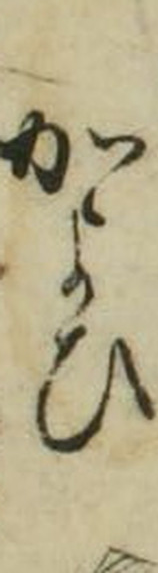かよひ
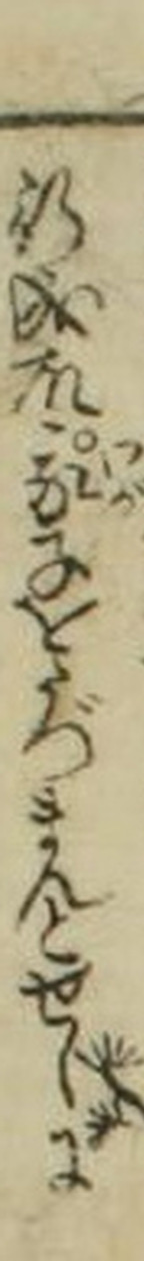行成様。我子をうづまんとせしに
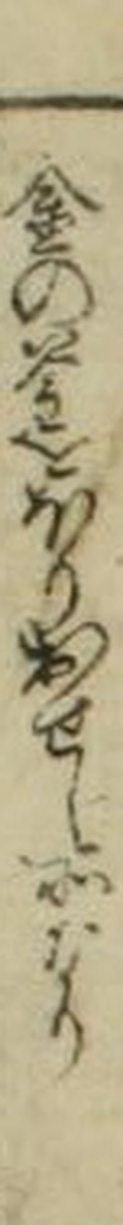金の釜をほり出せし所なり
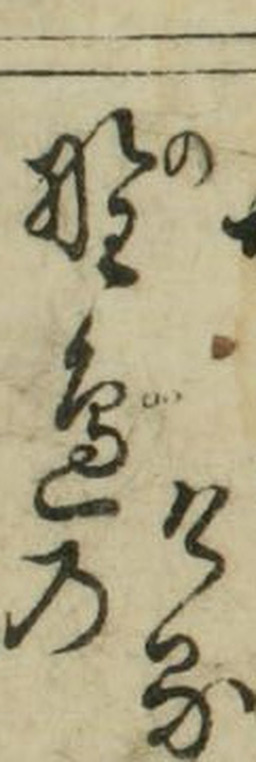野べの
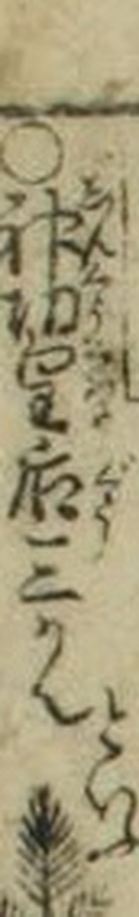○神功皇后三かん
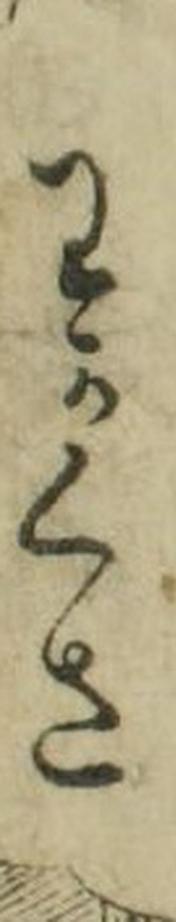わかくさ
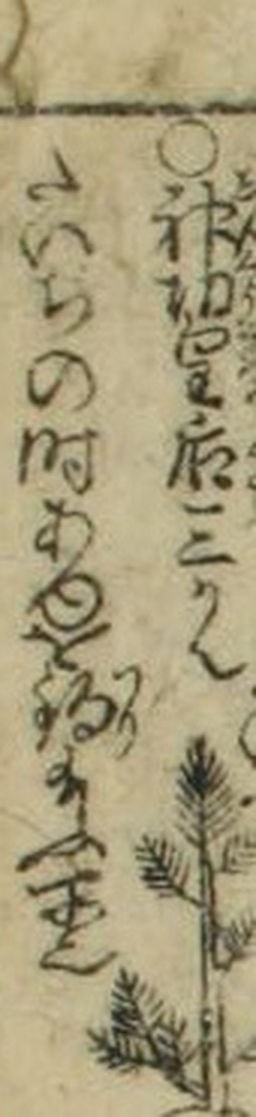たいぢの時あゆを釣給ふ所也

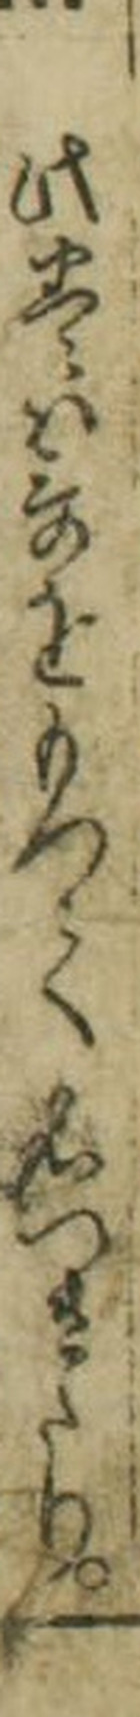此巻は哥をもつて名つきたり。
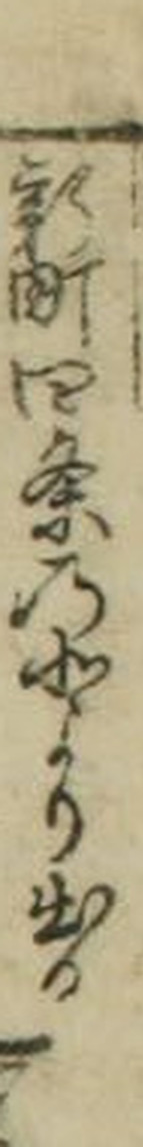新町四条の北より出る
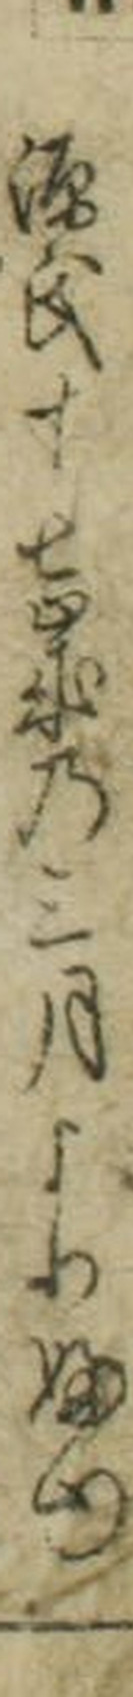源氏十七歳の三月よりふゆ
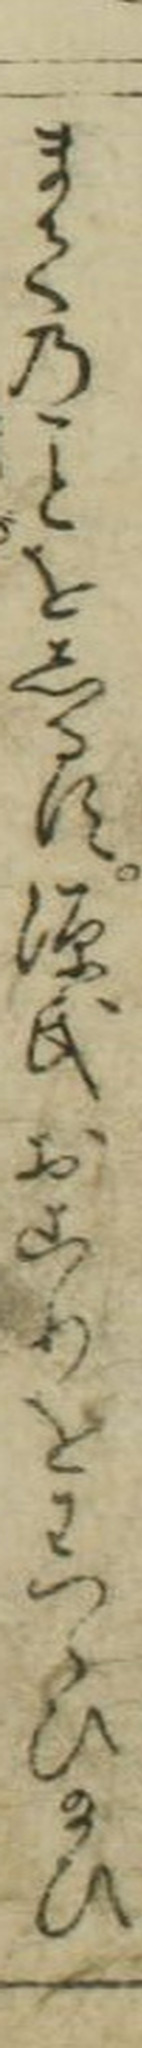まてのことをしるす。源氏おこりをわつらひ給ひ
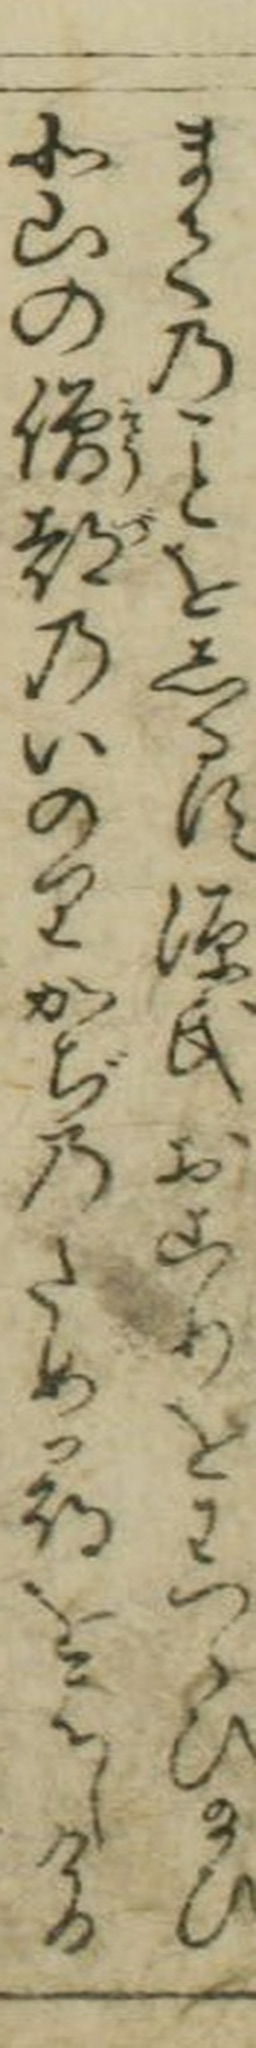北山の僧都のいのりかぢのため尋をはしける
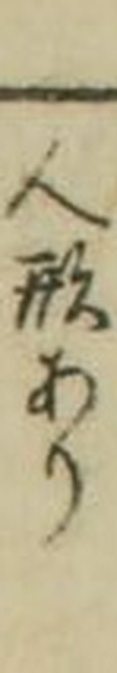人形あり
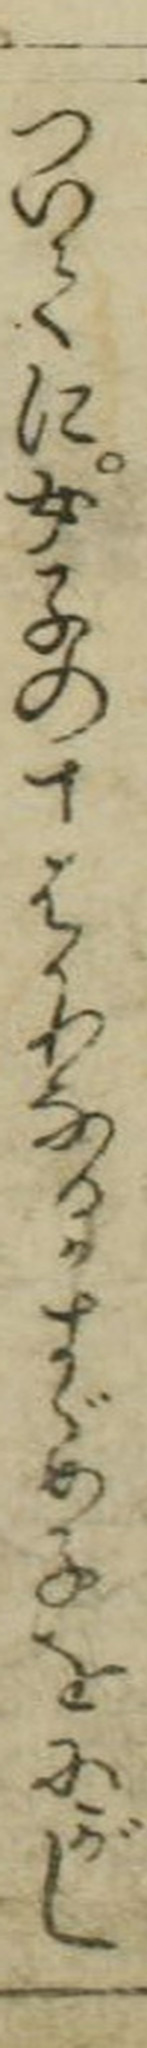ついてに。女子の十はかりなるかすゞめ子をにがし
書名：女源氏教訓鑑
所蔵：東京学芸大学附属図書館
